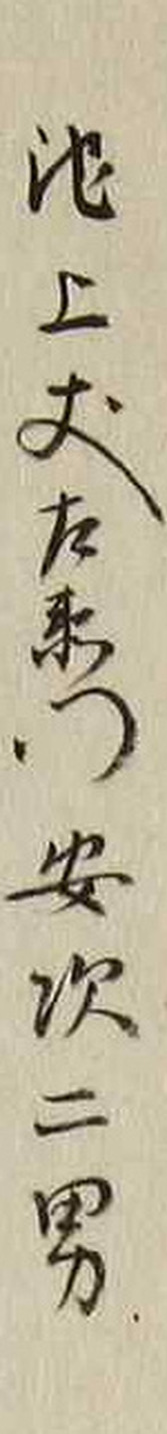池上丈左衛門安次二男
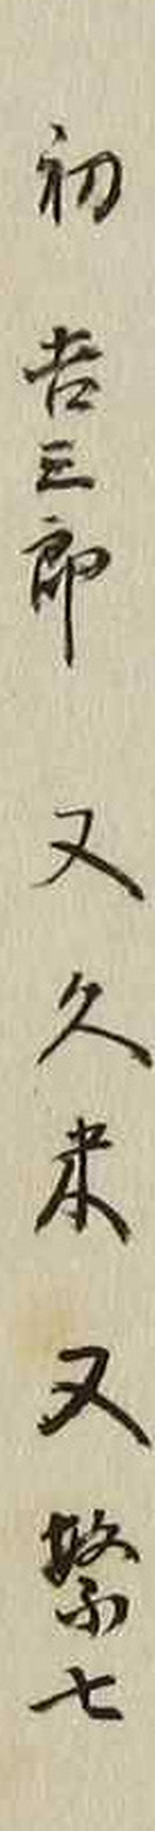初吉三郎又久米又繁七
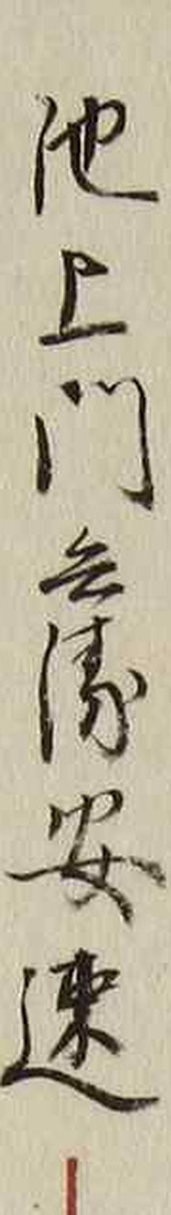池上門兵衛安速
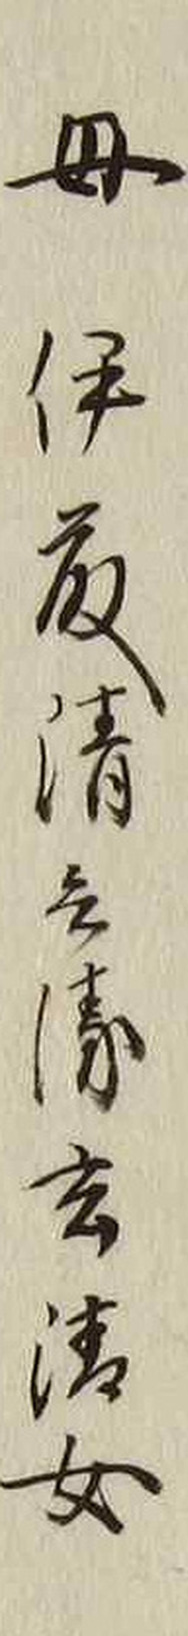母伊藤清兵衛玄清女
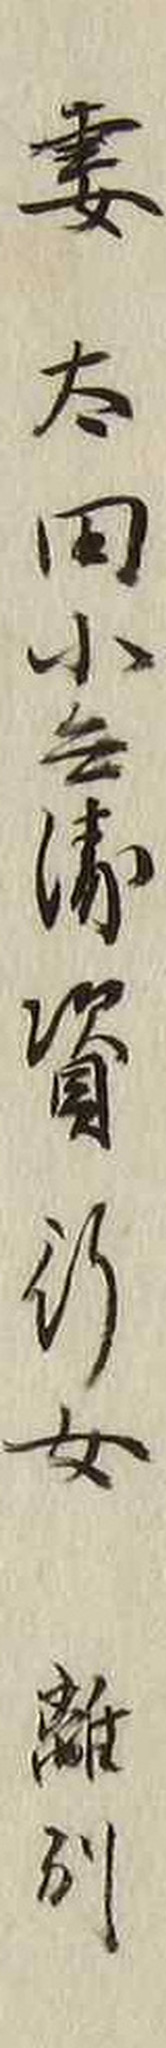妻太田小兵衛資行女離別
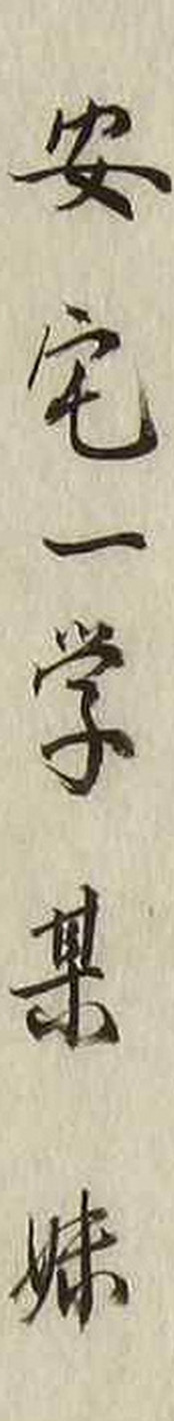安宅一学某妹
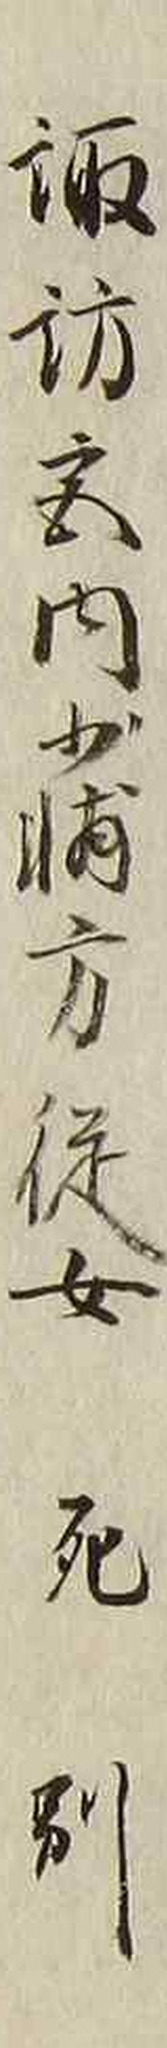諏訪宮内少輔方従女死別

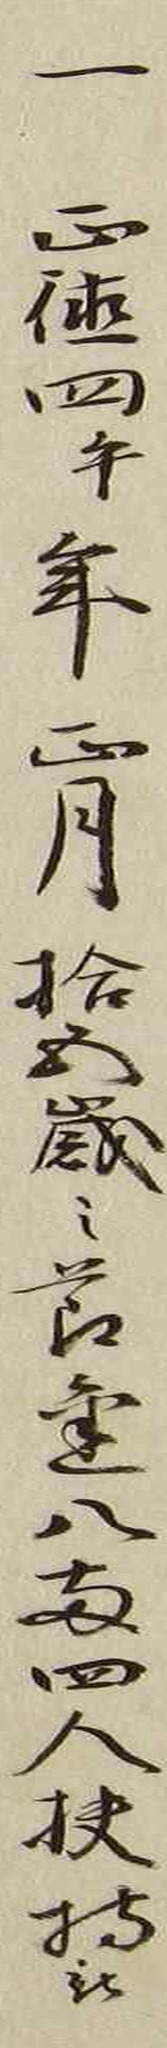一正徳四午年正月拾五歳之節金八両四人扶持
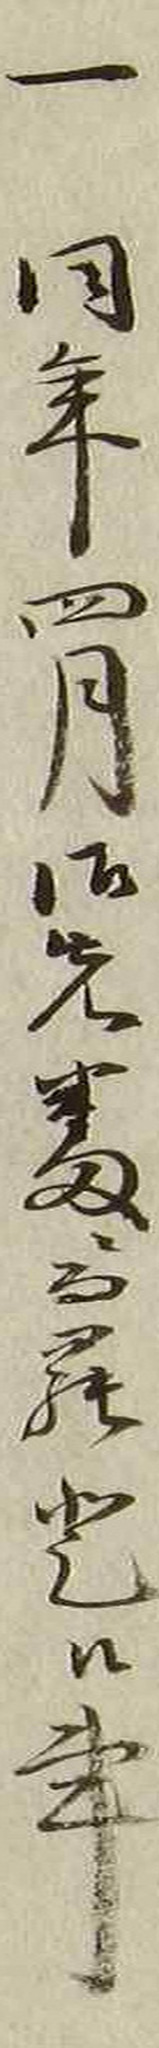一同年四月御先番ニて罷り登り候事
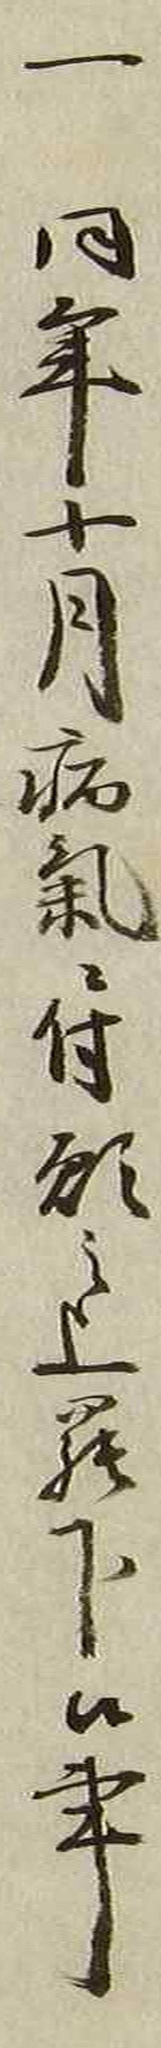一同年十月病気ニ付願之上罷り下り候事
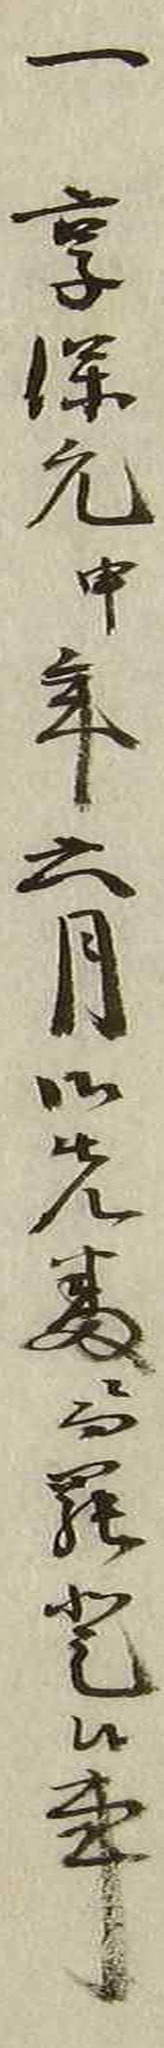一享保元申年六月御先番ニて罷り登り候事
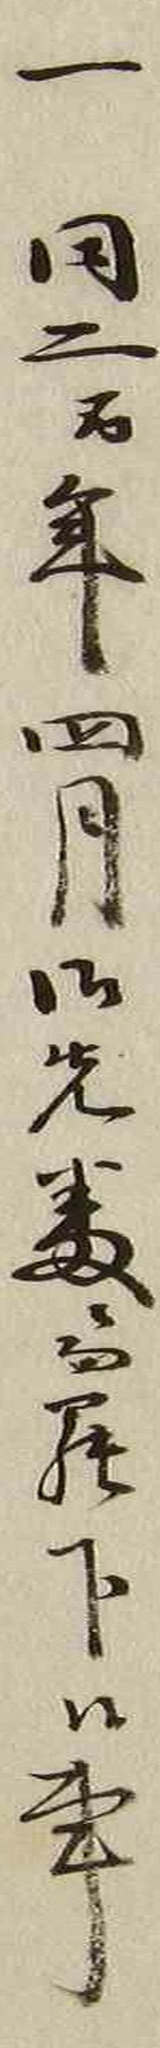一同二酉年四月御先番ニて罷り下り候事
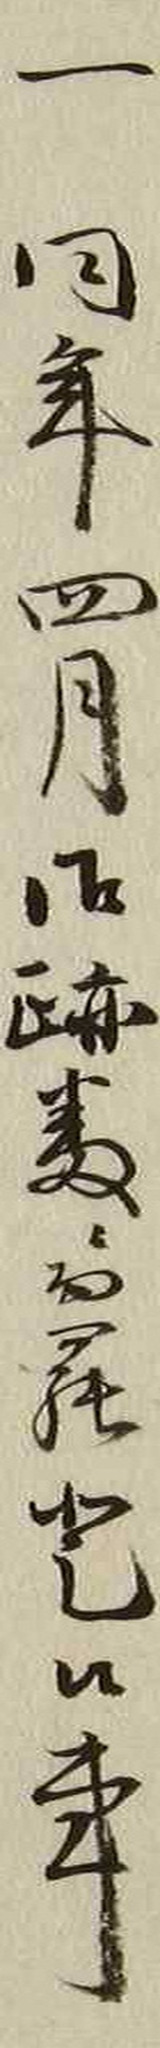一同年四月御跡番ニて罷り登り候事
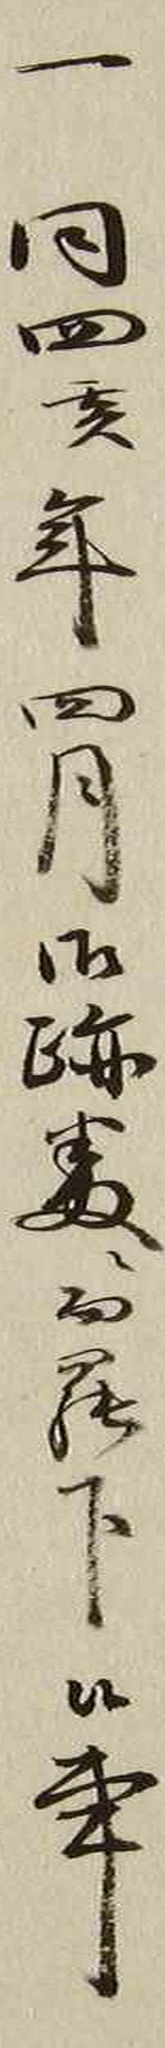一同四亥年四月御跡番ニて罷り下り候事
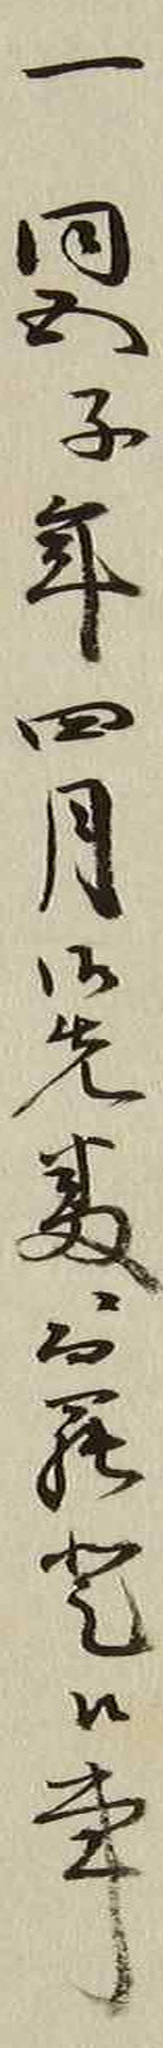一同五子年四月御先番ニて罷り登り候事
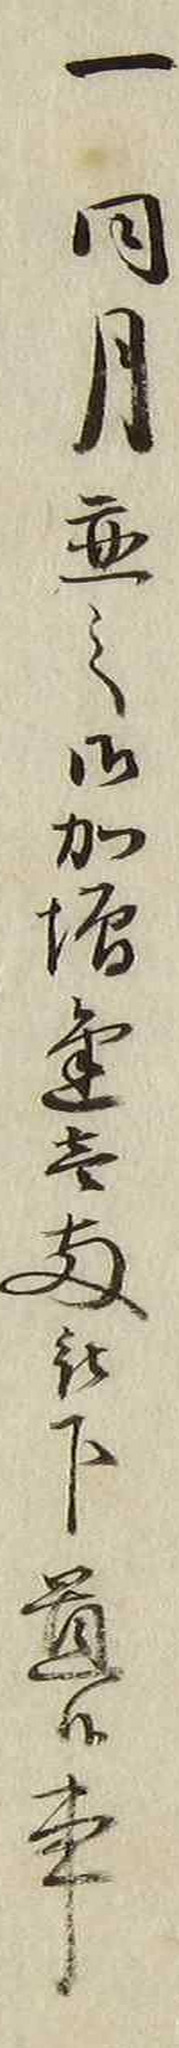一同月並之御加増金壱両下し置かれ候事
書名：諸士系譜　巻之19　い之部19
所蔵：会津若松市立会津図書館
